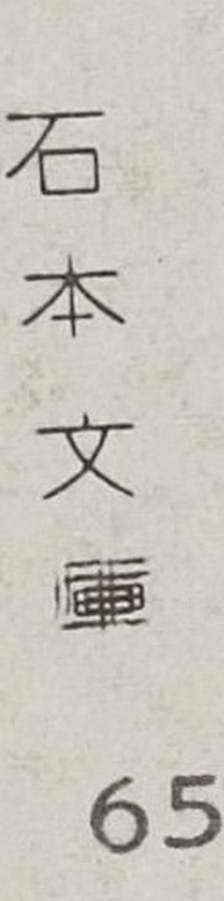石本文庫
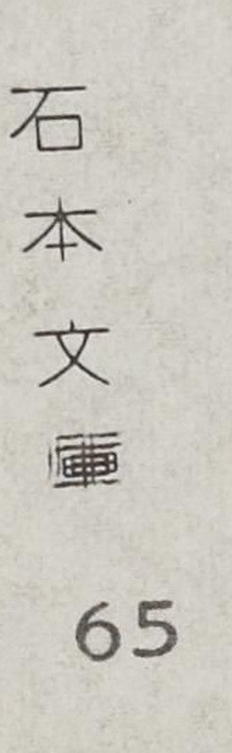石本文庫
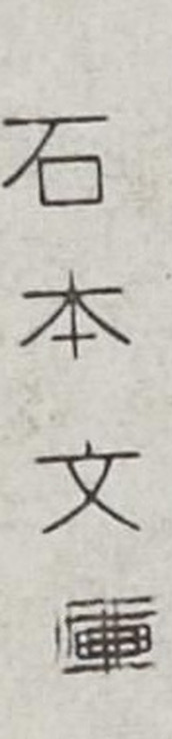石本文庫
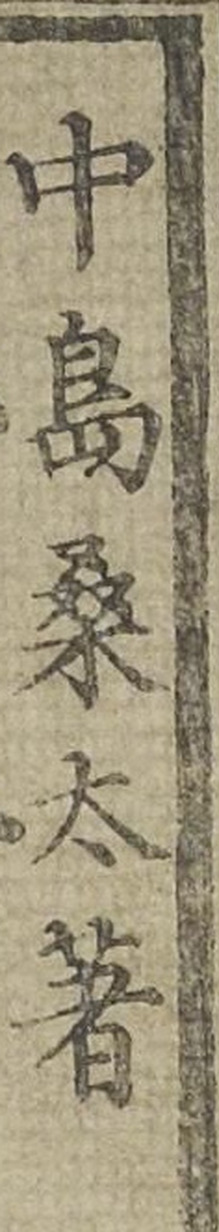中島桑太著

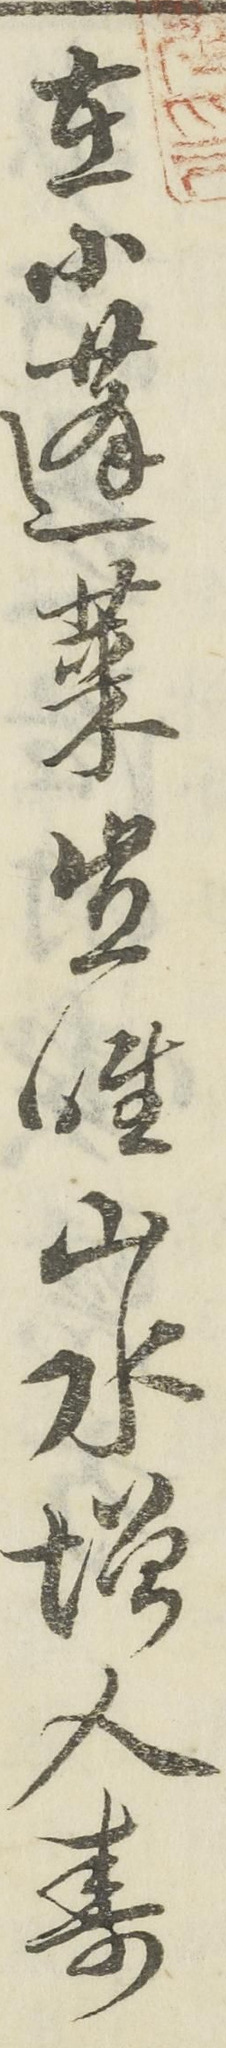在小蓬莱豈唯山水増人寿
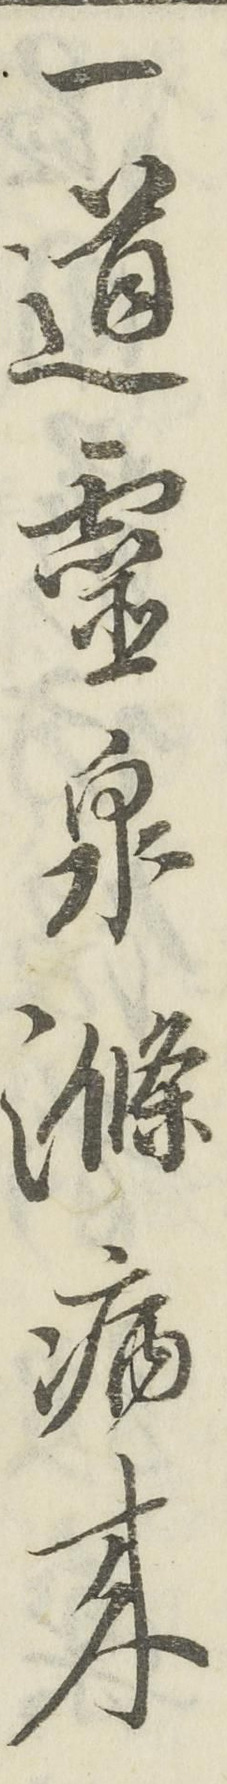一道霊泉滌病来
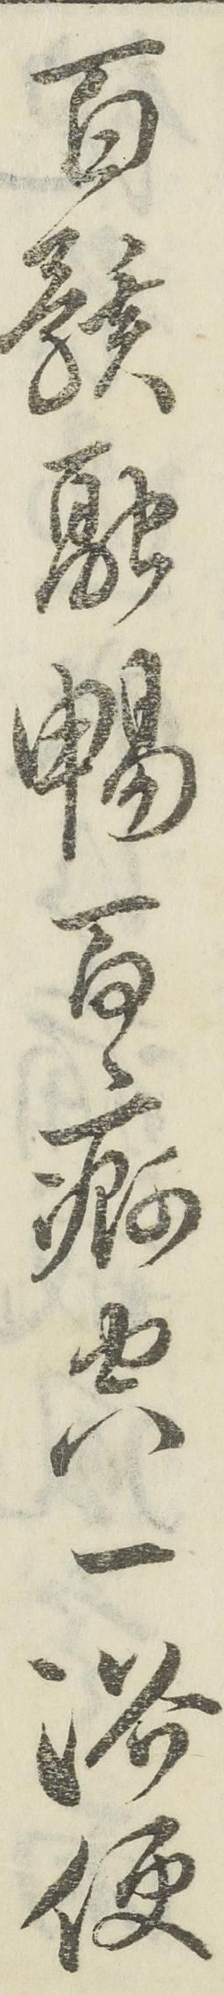百骸融暢百痾空一浴便
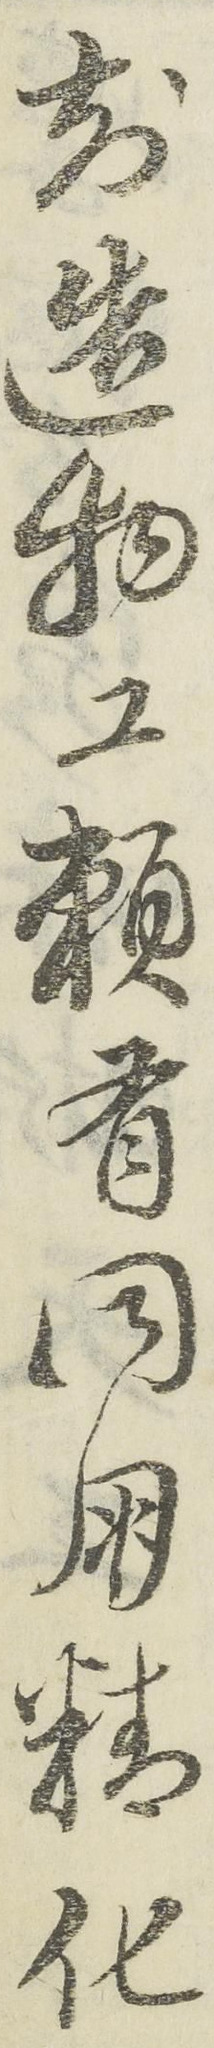知造物工頼有同朋精化

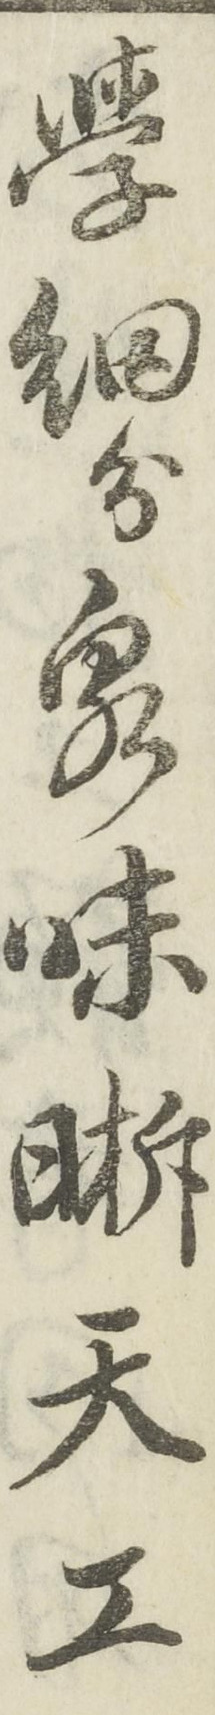学細分泉味晰天工
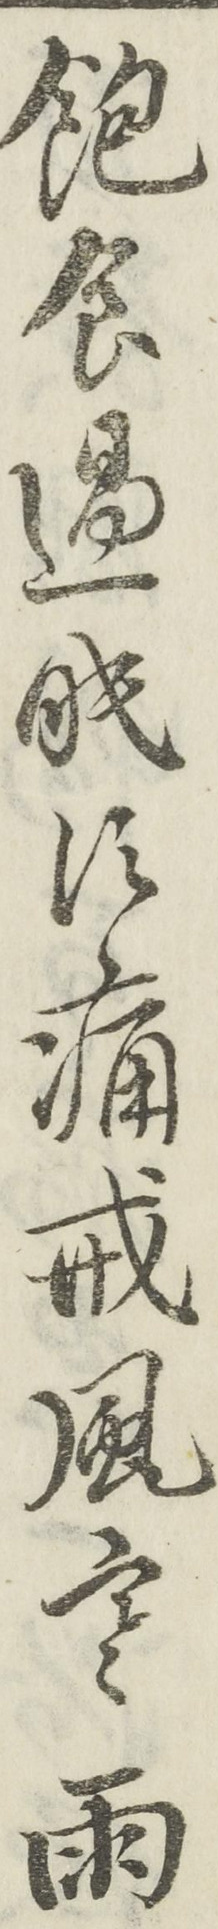飽食過眠須痛戒風寒雨
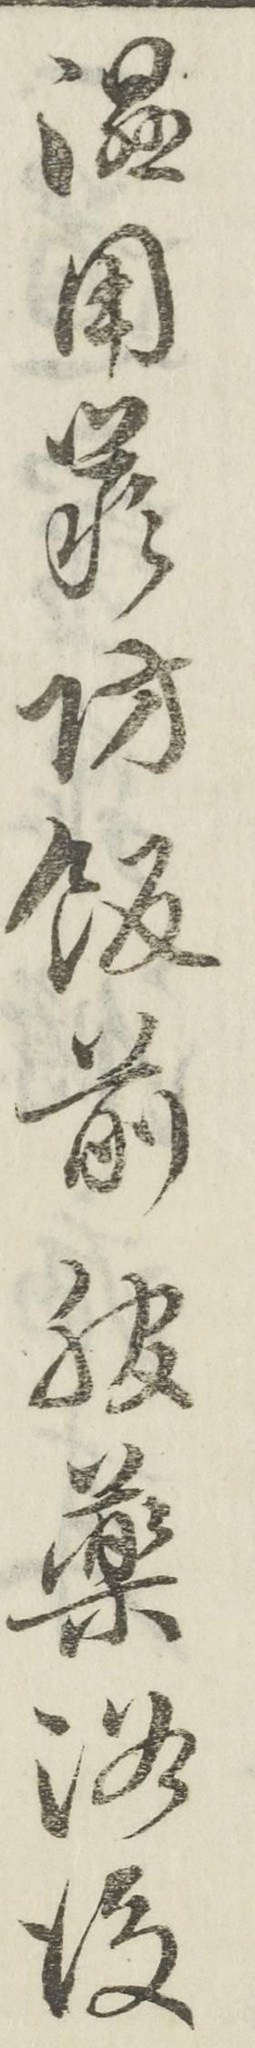湿用厳防飯前服薬浴後
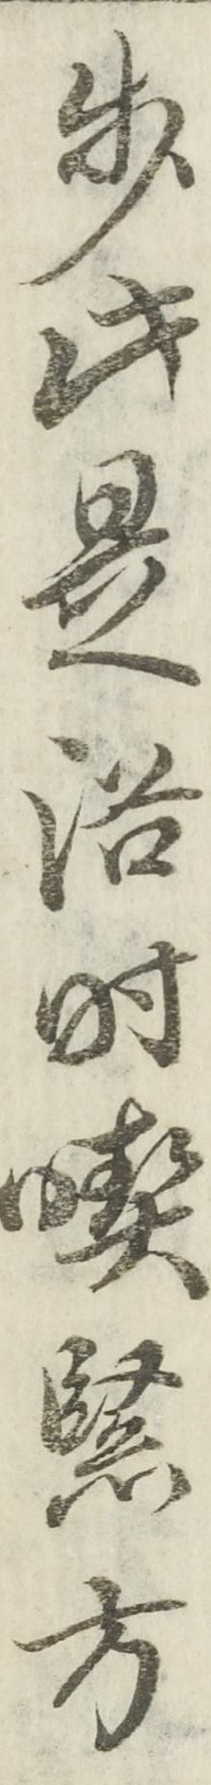歩此是浴時喫緊方
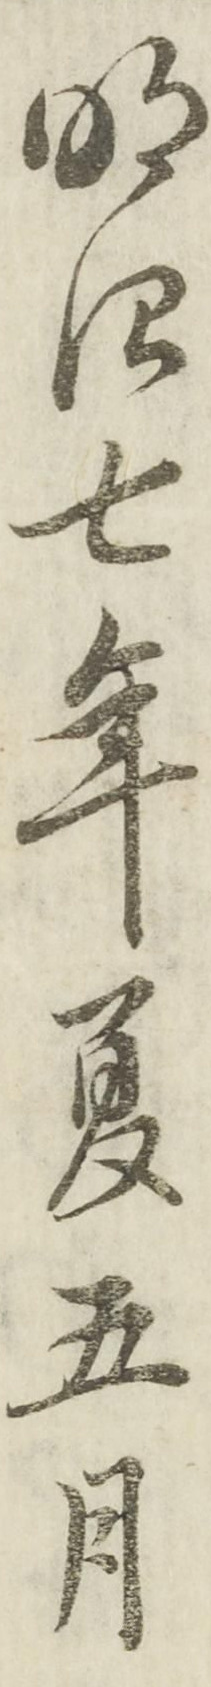明治七年夏五月
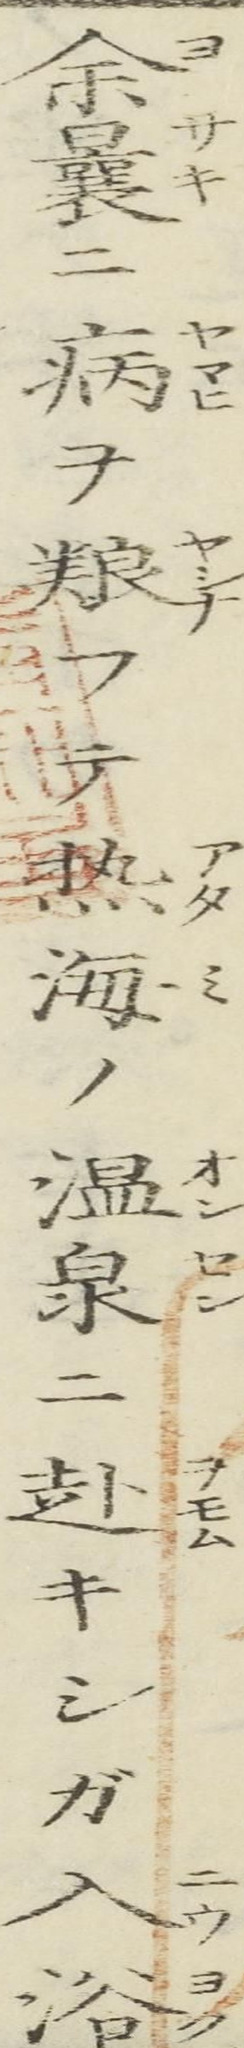余曩ニ病ヲ養フテ熱海ノ温泉ニ赴キシガ入浴
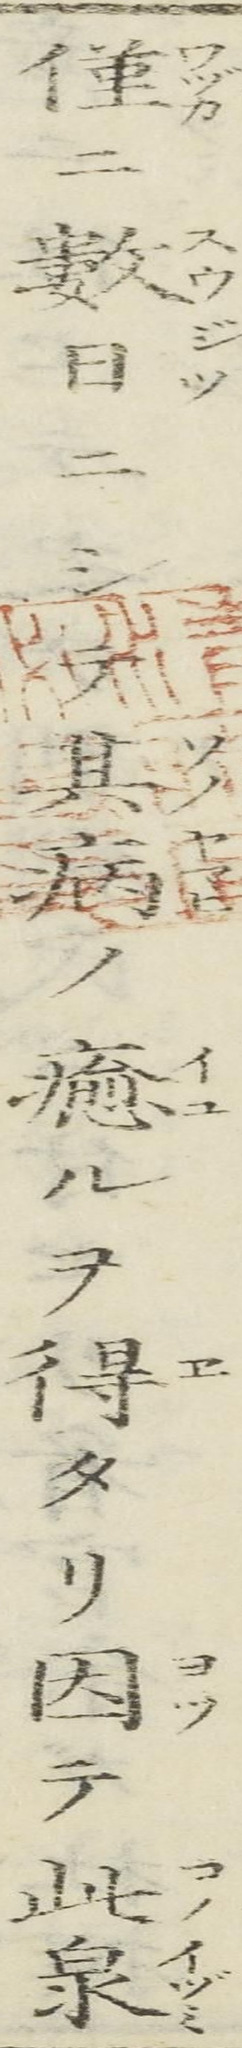僅ニ数日ニシテ其病ノ癒ルヲ得タリ因テ此泉
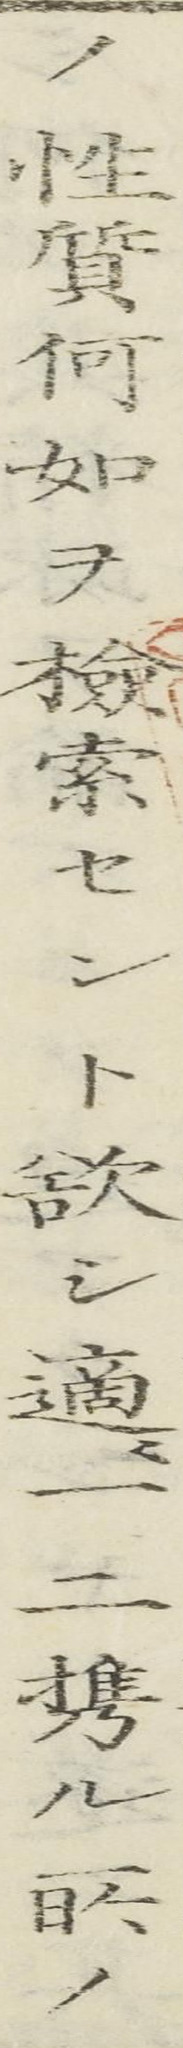ノ性質何如ヲ検索セント欲シ適々一二携ル所ノ
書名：熱海温泉考　全
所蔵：東京大学地震研究所図書室 Earthquake Research Institute Library, The University of Tokyo, JAPAN
